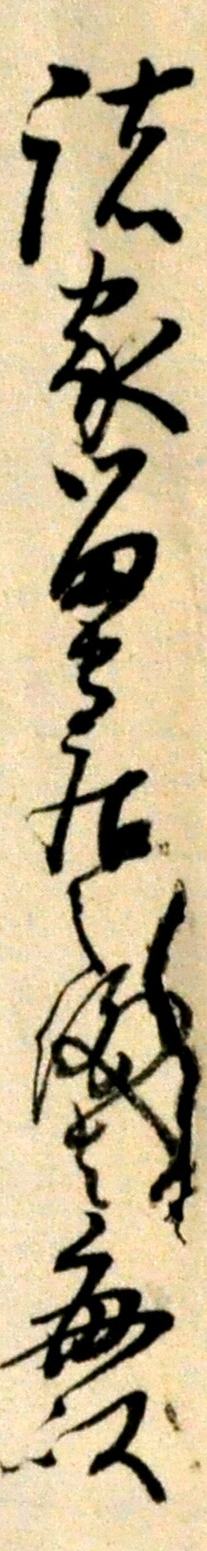諸家留守居之儀は毎以
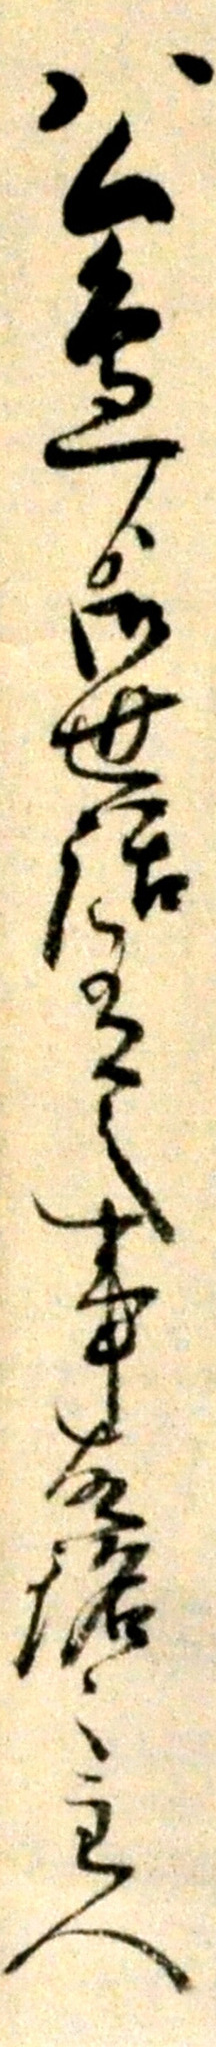公辺ゟ御世話有之事故銘々主人
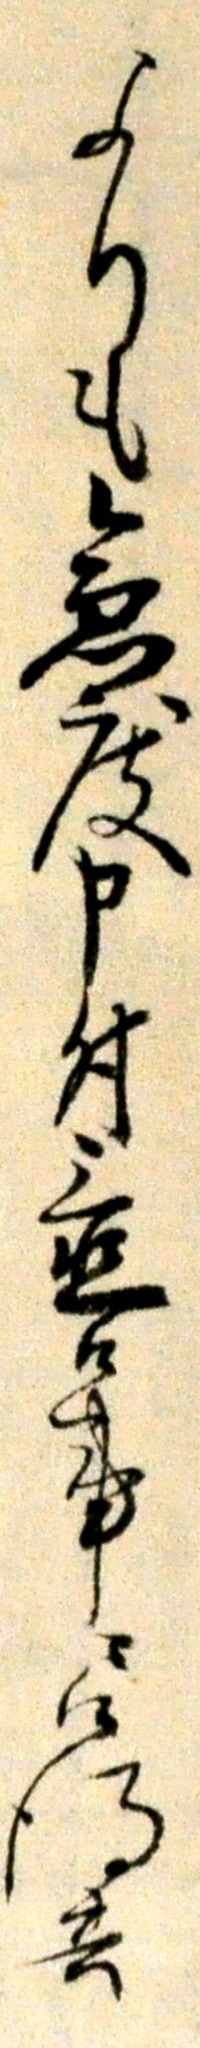よりも急度申付置候事に候得共
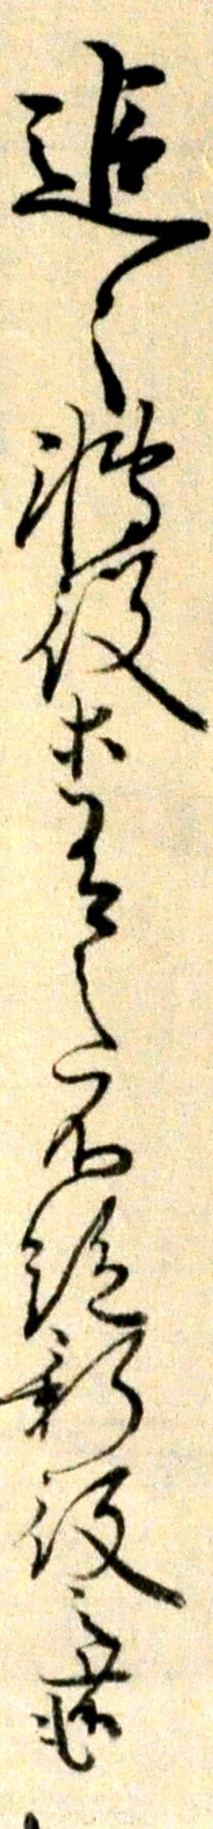追々転役等有之不絶新役之者も
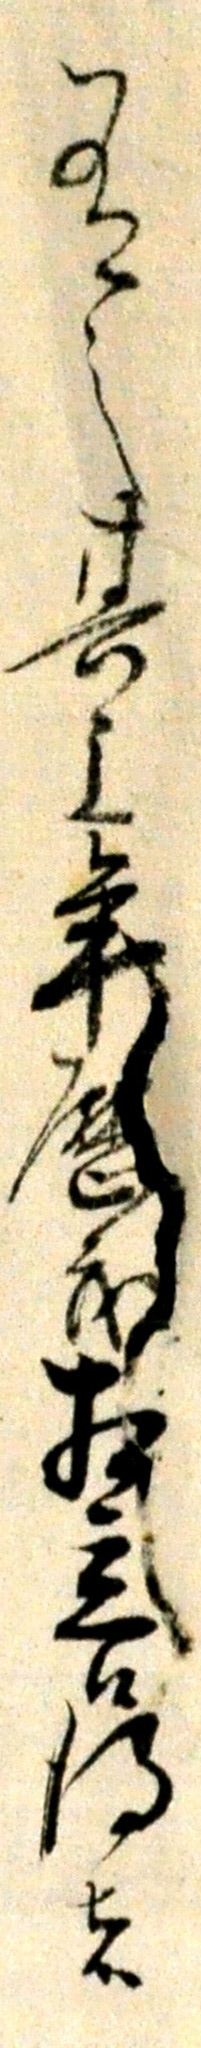有之其上年歴も相立候得は
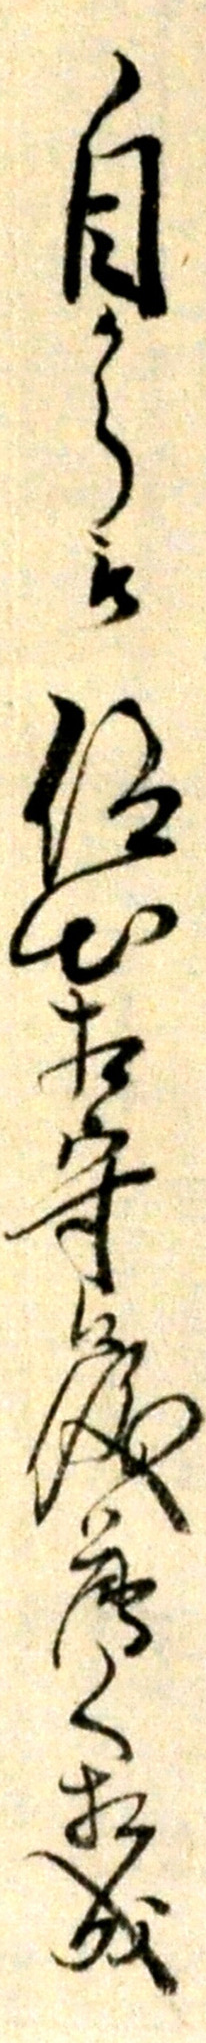自から被仰出相守候儀薄く相成
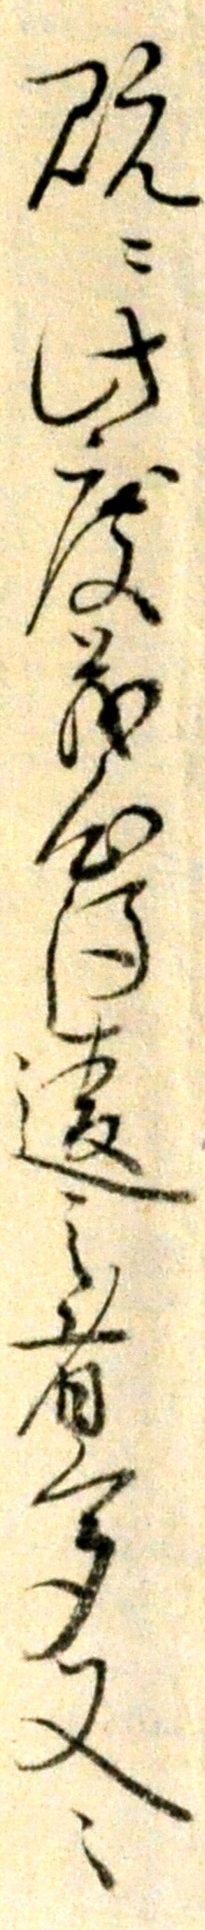既に此度も心得違之者多又々
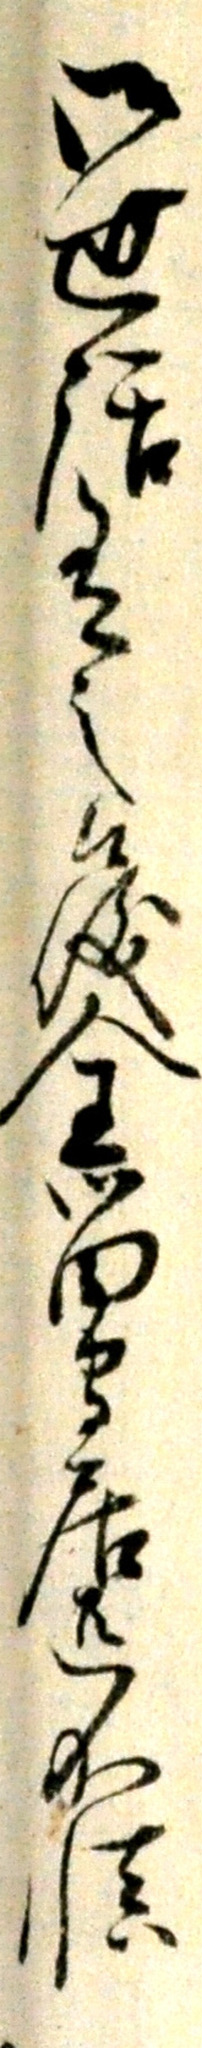御世話有之候儀全留守居共不慎
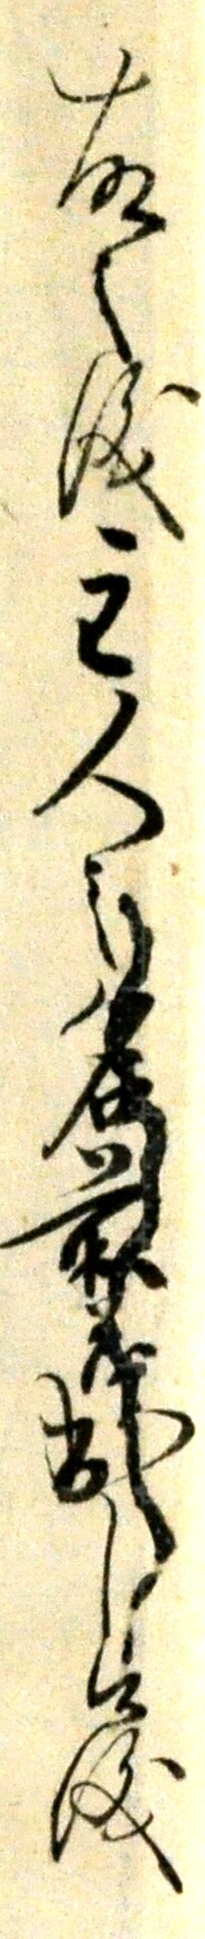故之儀主人之名前も出し候儀

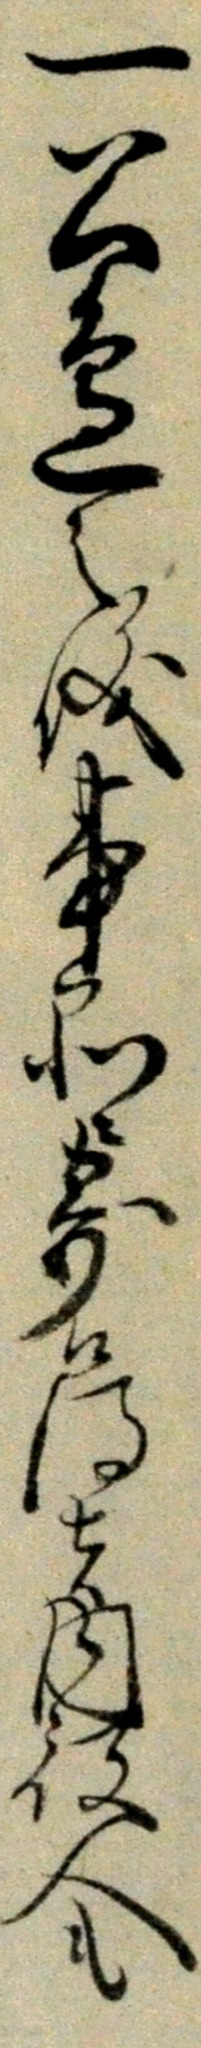一公辺之儀事品に寄候得は内役人も
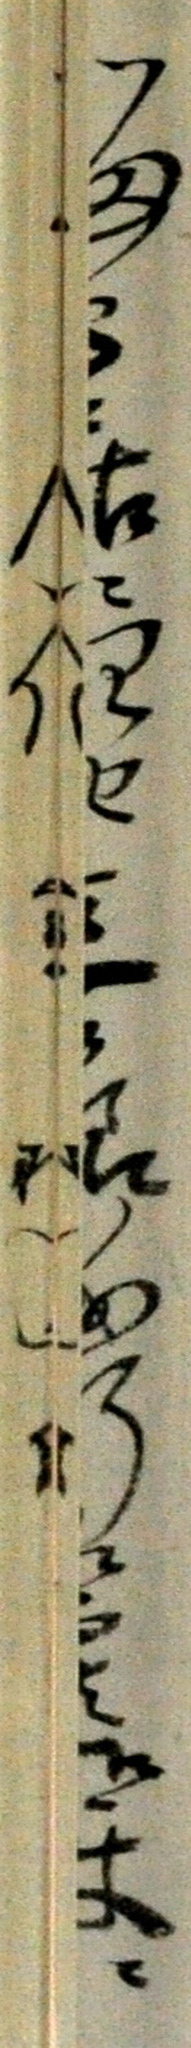留守居に任せ置候様成行にては御互に
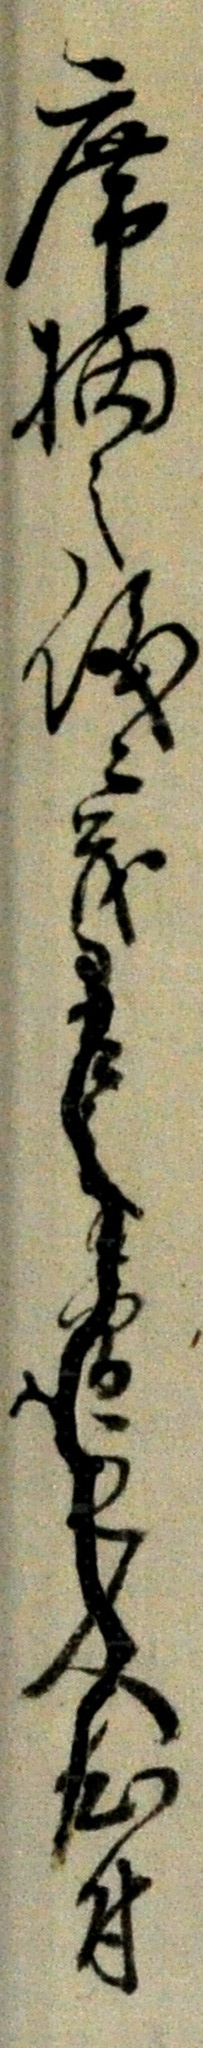席柄之儀にも有之候間主人心付
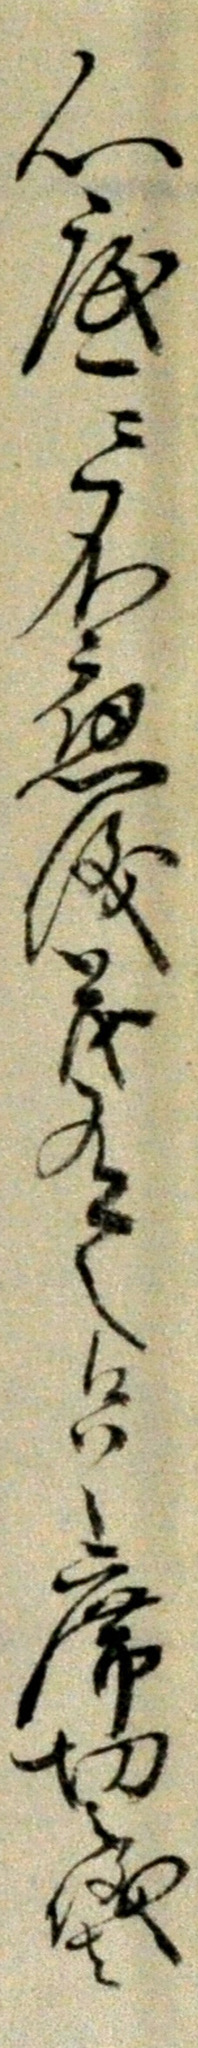心底に不応儀も有之候はゝ席切之儀は
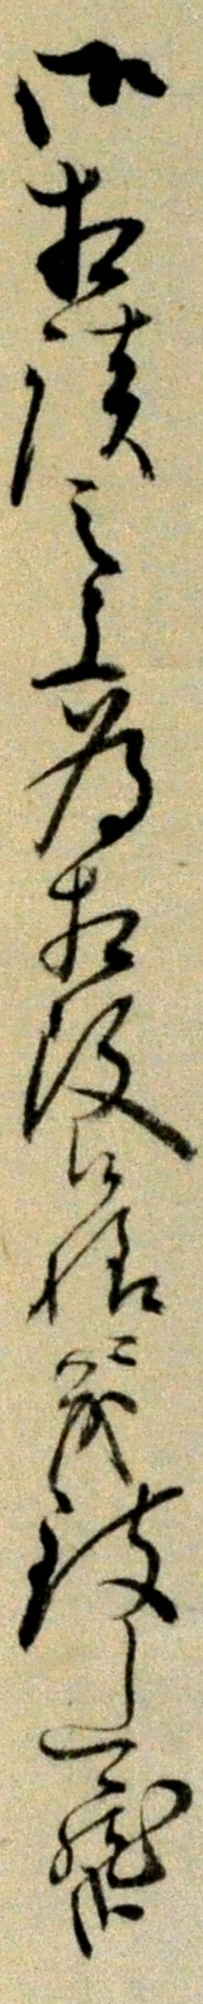御相談之上為相改候様にも致し可然哉
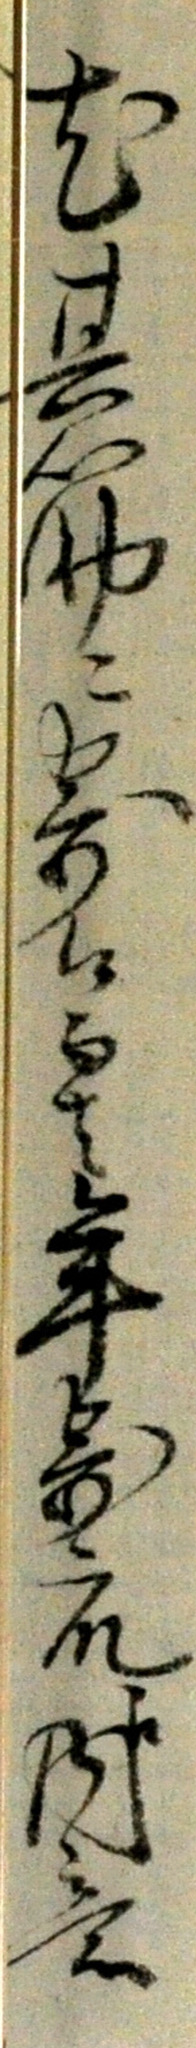尤其筋に寄候ては年寄衆え内意
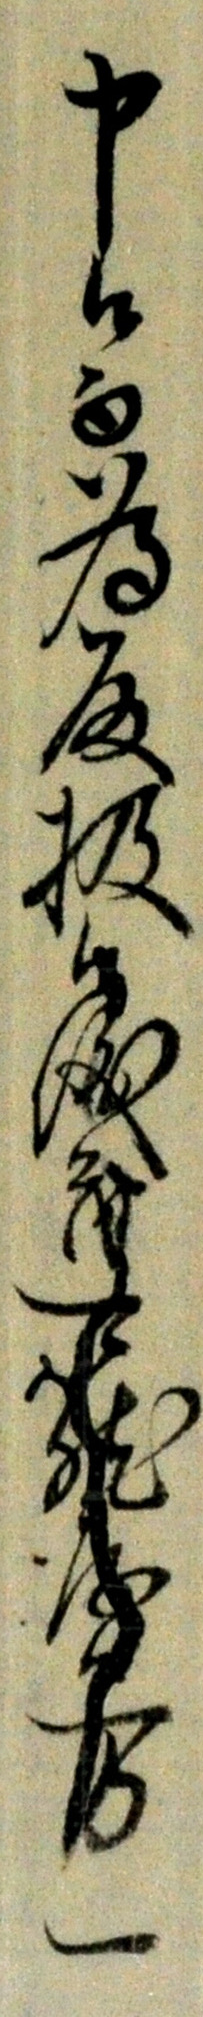申候て為取扱候儀も可然儀候万一
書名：申合帳〔一括〕
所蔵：伊那市立高遠町図書館・合同会社AMANE
